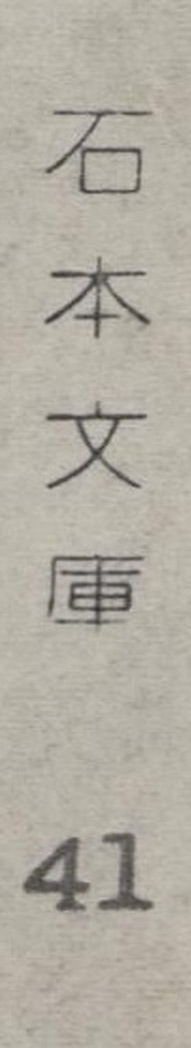石本文庫

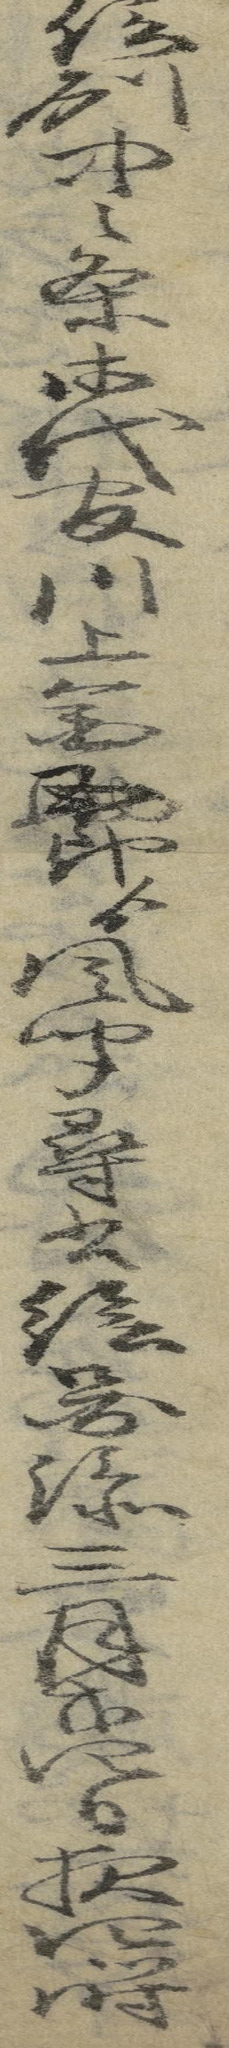信州中之条御代官川上金五郎ゟ風聞尋書絵図添三月廿四日夜四ッ時
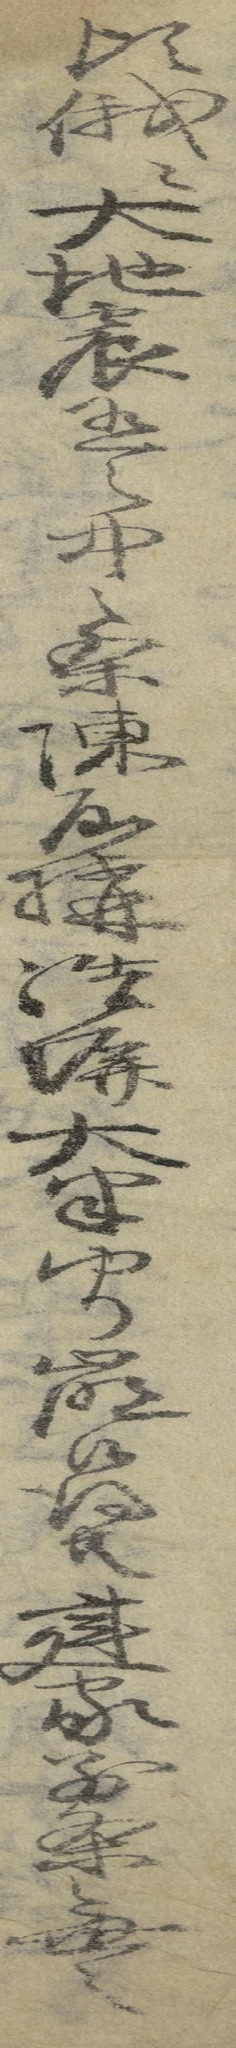頃俄ニ大地震有之．中之条陣屋構結塀大半ゆり崩候得共建家別条無之
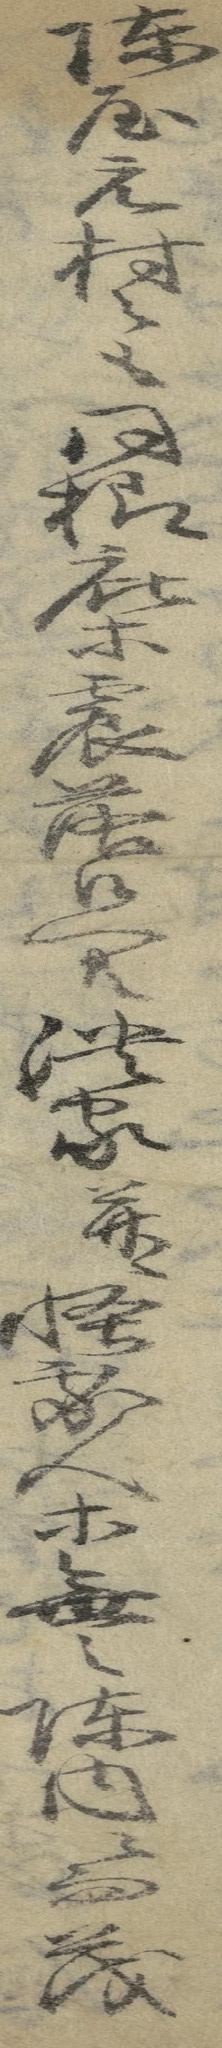陣屋元村々も同様庇等震落候へ共潰家并ニ怪我人等無之陣内ニ而茂
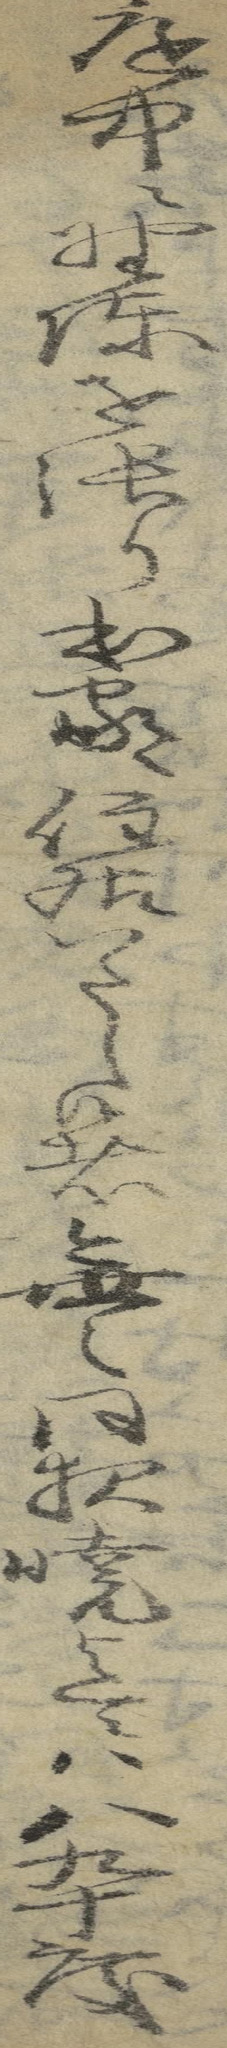庭中ニ野陣を張り本家へ住居いたし候者無之同夜暁迄ニハ八九十度
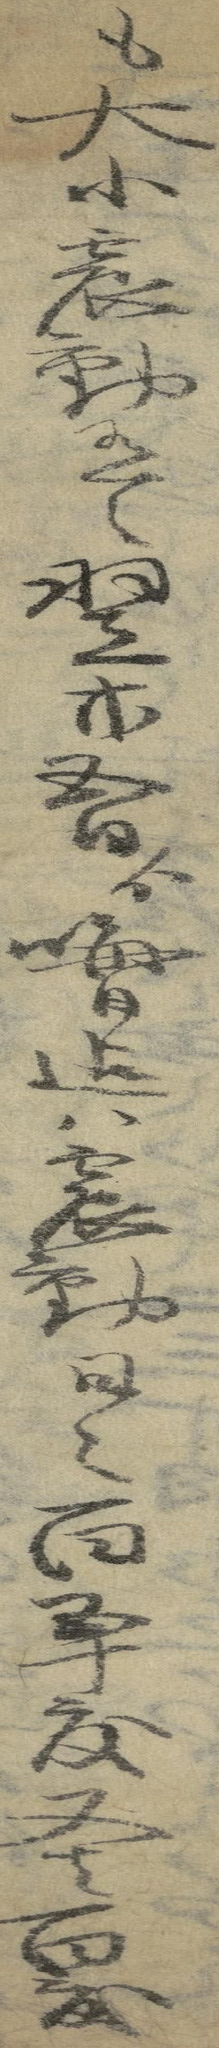も大小振動有之翌廿五日より晦日迄ハ振動日々百五十度又者百度
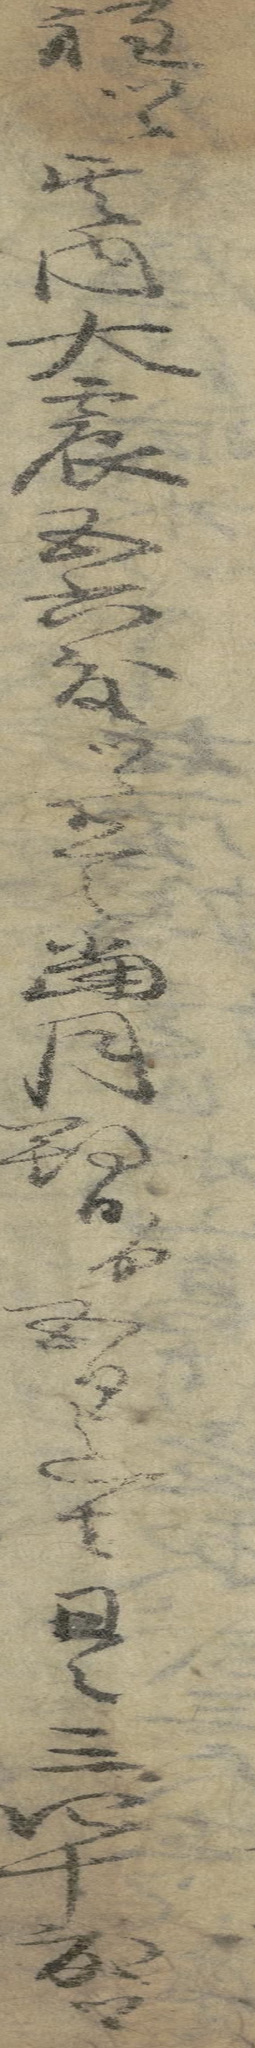程ツヽ其内大震五六度ツヽ有之当月朔日より五日迄者日々三四十度ツヽ
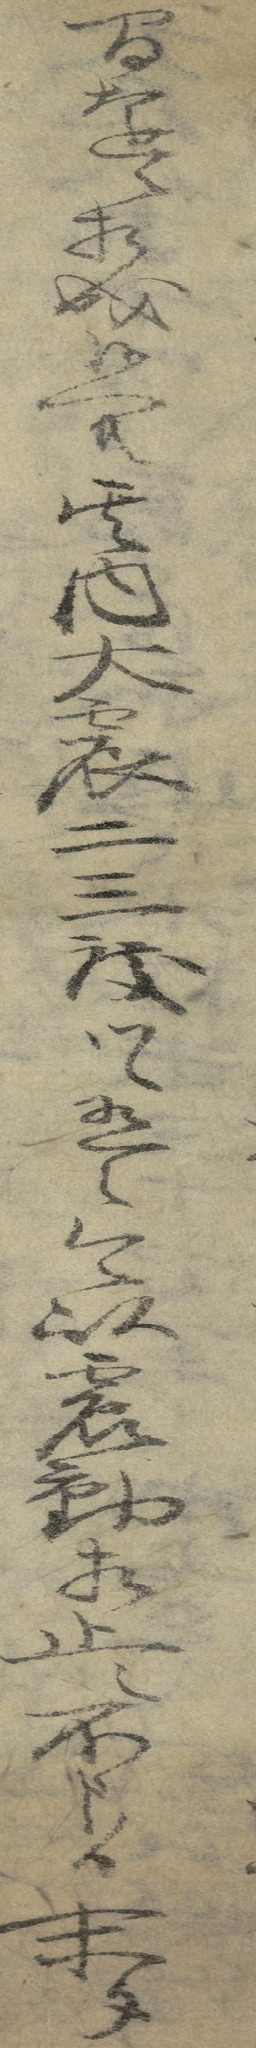間遠ニ相成候へ共其内大震二三度ツヽ有之今以振動相止ミ不申候未タ
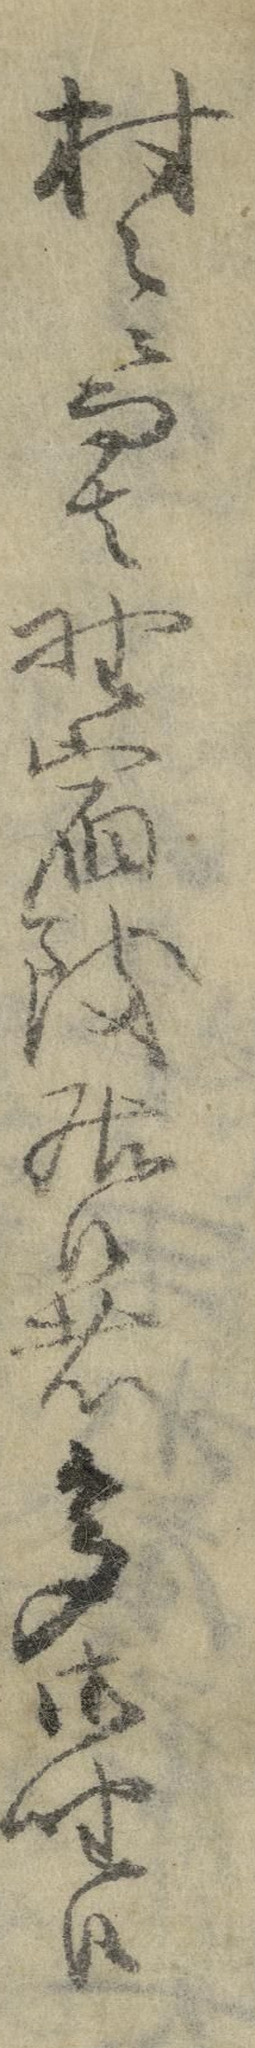村々ニ而者野宿致居候者多御座候
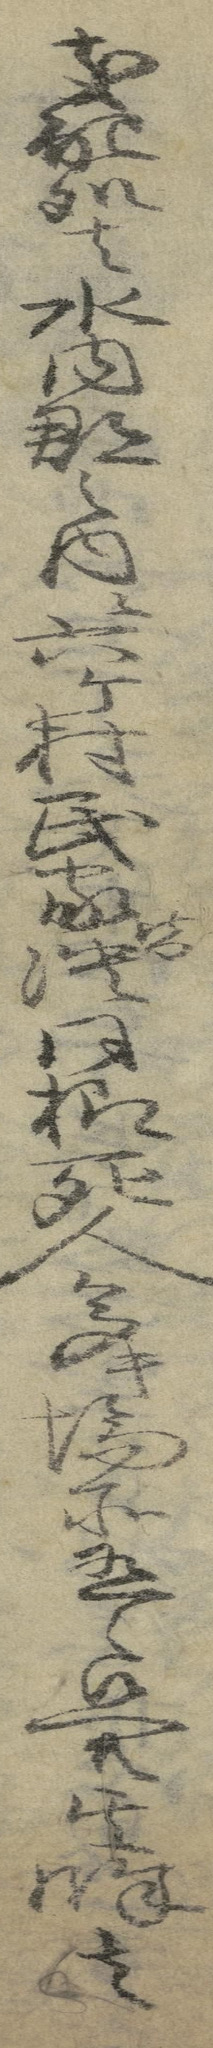一支配処者水内郡之内ニ六ヶ村民家皆潰同様死人多キ場所有之候ヘ共其余者
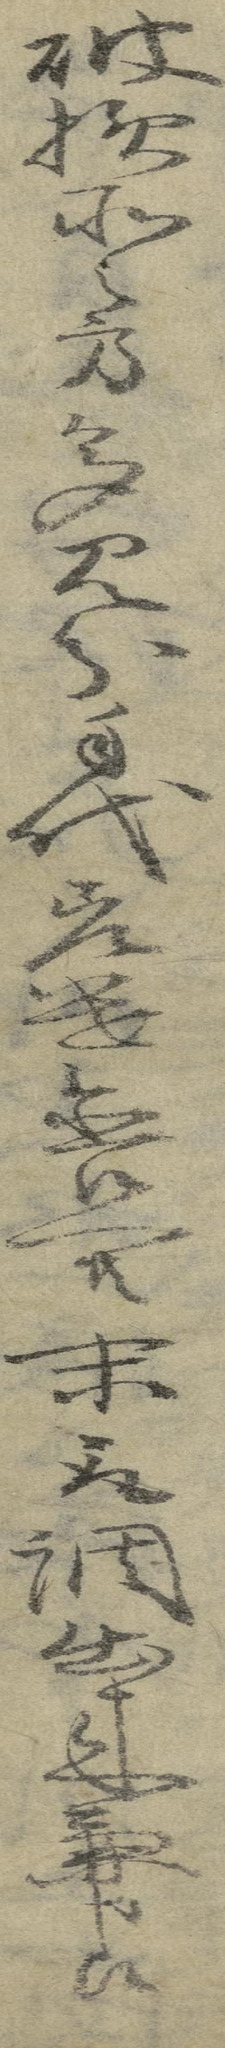破損所之方多見分手代差遣置候ヘ共未取調出来兼申候
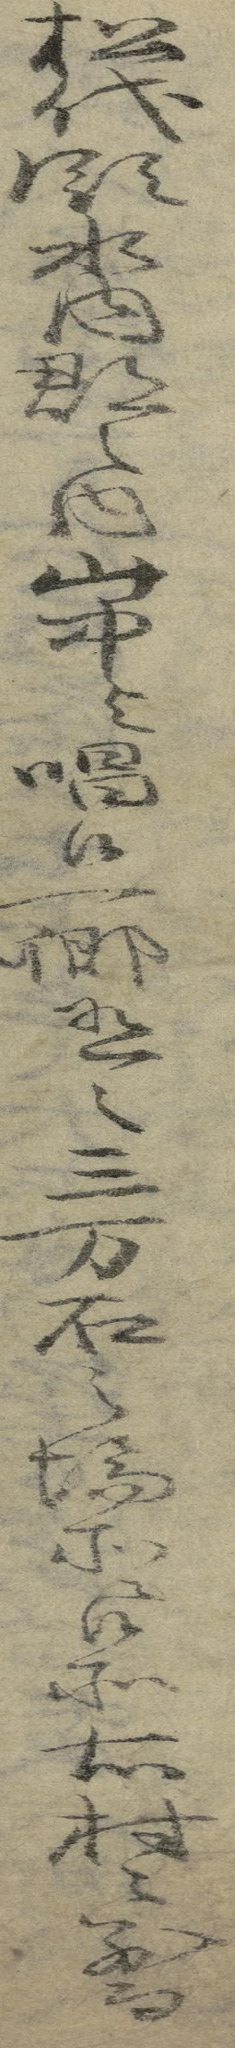一松代領水内郡之内山中与唱候一郷有之三万石之場所ニ候所右村々別而
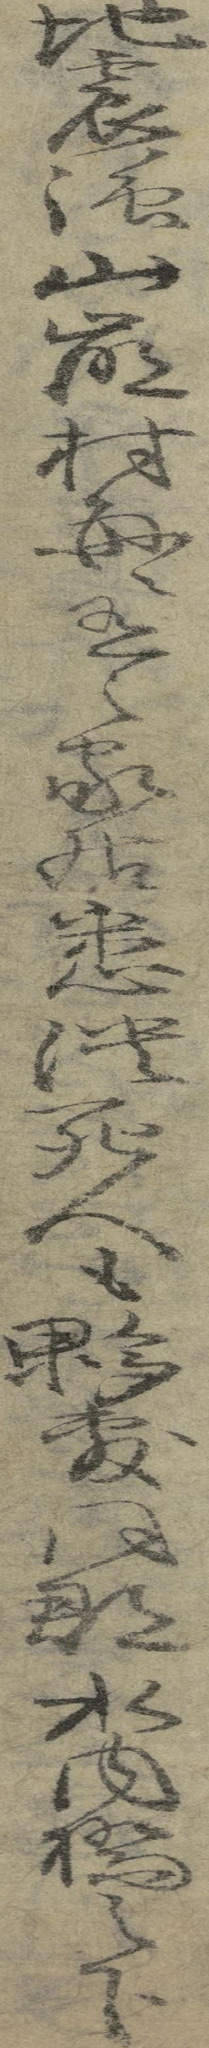地震強山崩村毎ニ有之家居悉潰死人も夥敷同郡水内橋之下

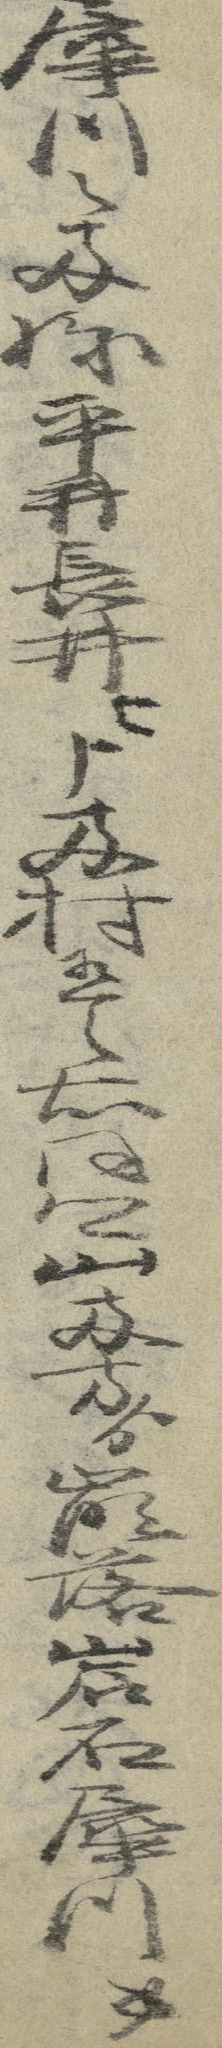犀川之両縁平井長井と申両村有之右同日山両方ゟ崩落岩石犀川ヲ
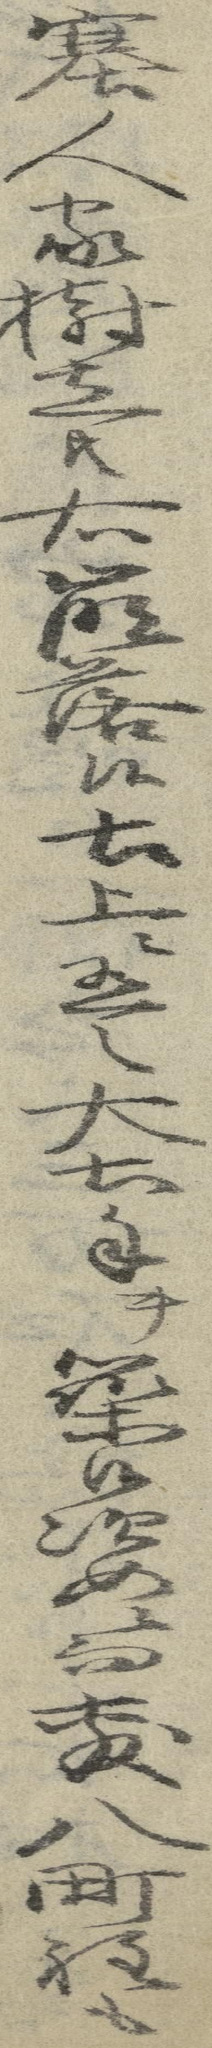塞人家樹立共右崩落候土上ニ有之大土手ヲ築候姿ニ而森八町程も
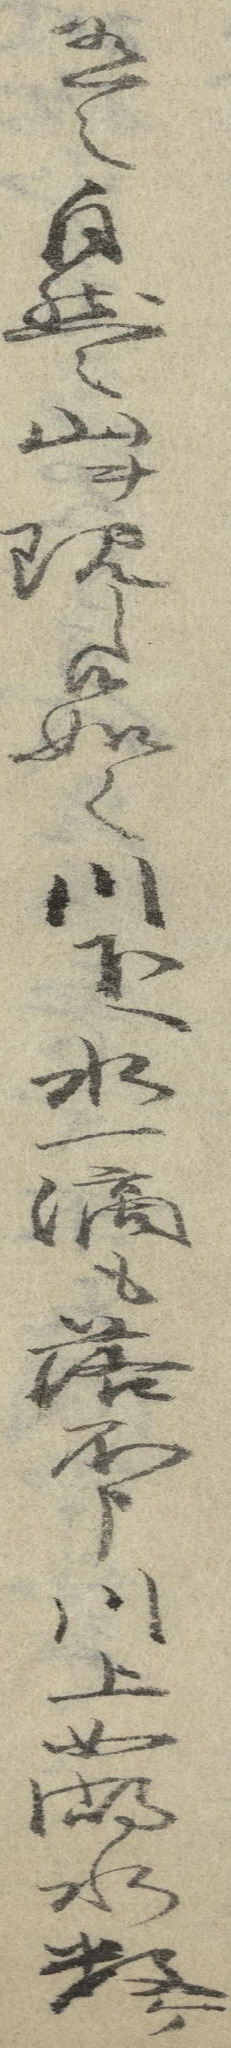有之自然之山ヲ現し候如く川下へ水一滴も落不申川上如湖水数ヶ
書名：[善光寺地震被害書上]
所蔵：東京大学地震研究所図書室 Earthquake Research Institute Library, The University of Tokyo, JAPAN
